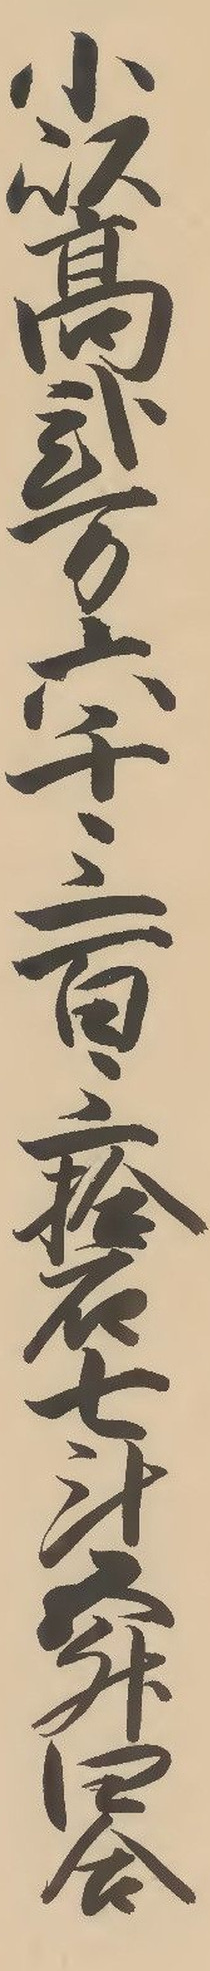小以高弐万六千三百三拾石七斗五升四合
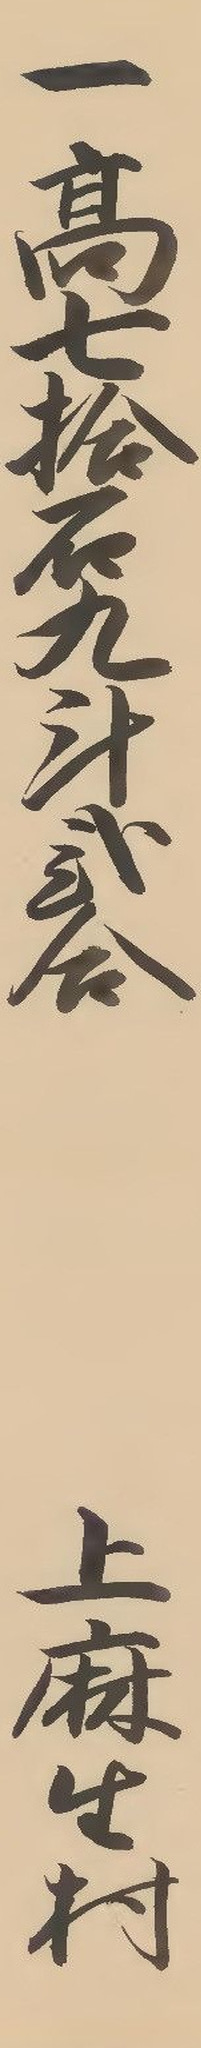一高七拾石九斗弐合上麻生村

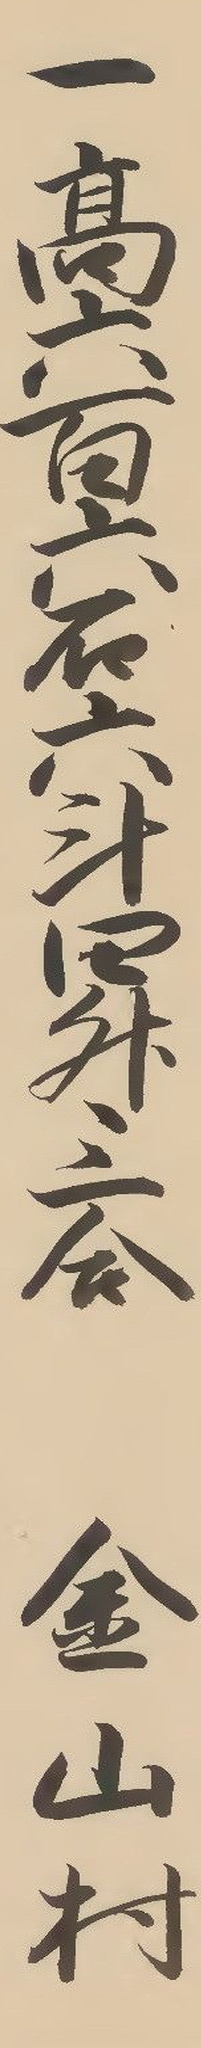一高六百六石六斗四升三合金山村
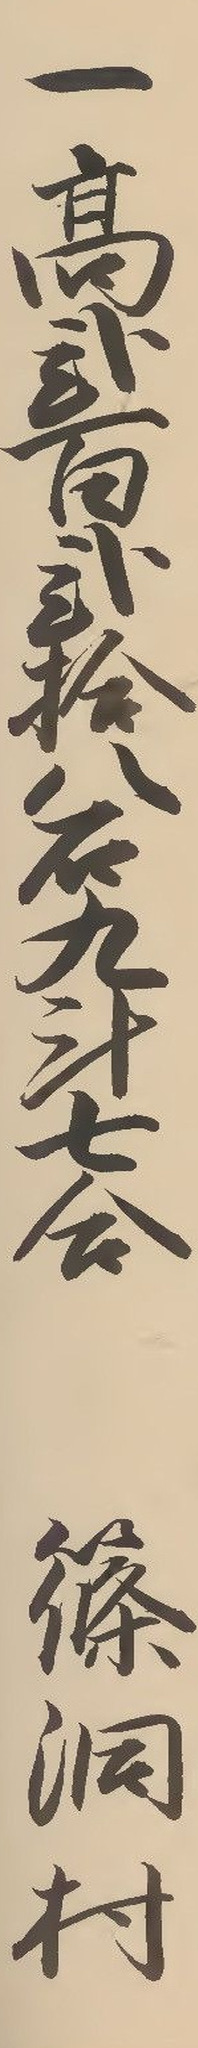一高弐百弐拾八石九斗七合篠洞村

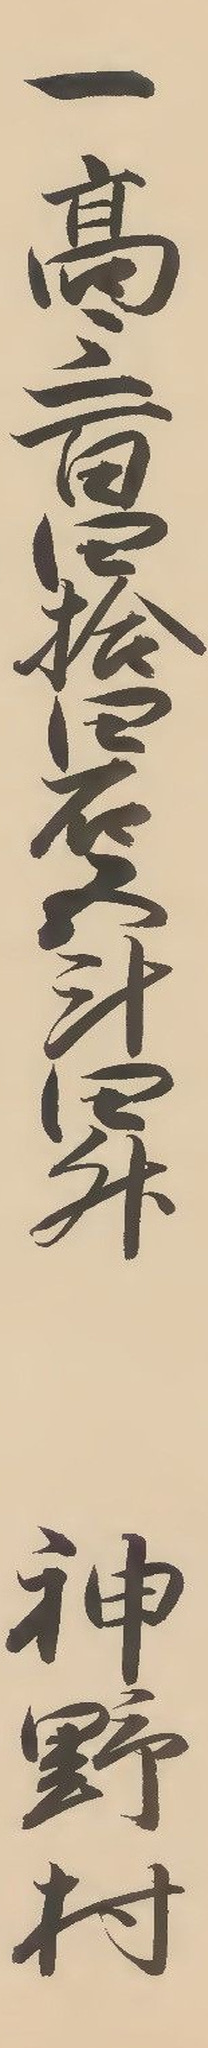一高三百四拾四石五斗四升神野村
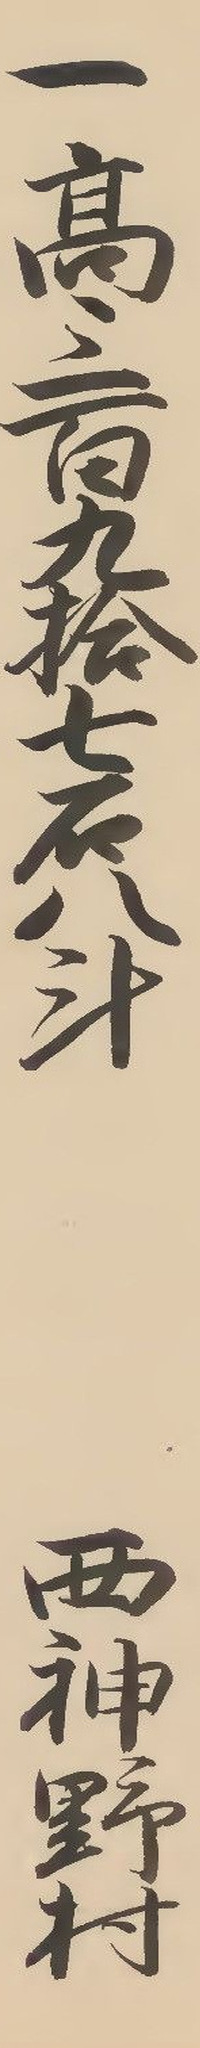一高三百九拾七石八斗西神野村
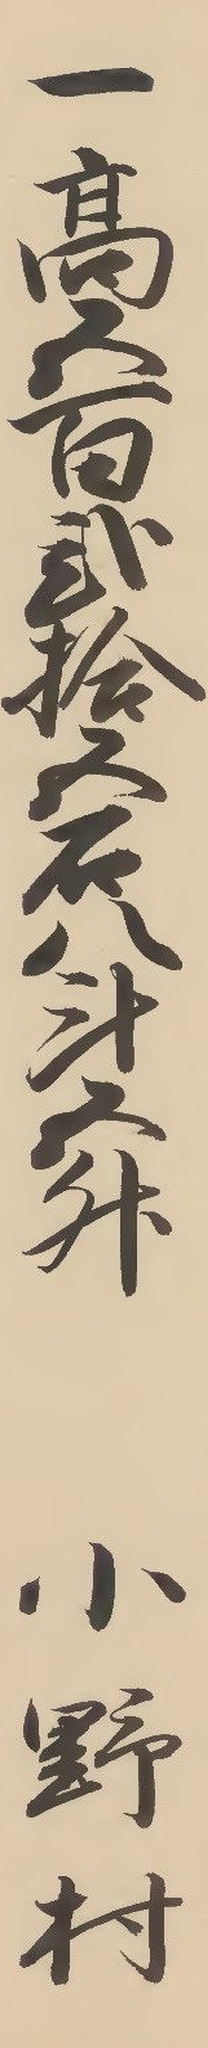一高五百弐拾五石八斗五升小野村
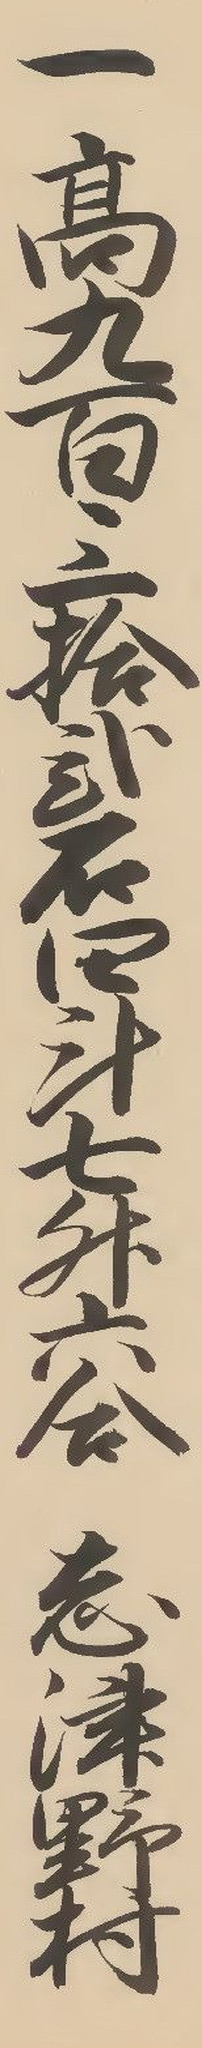一高九百三拾弐石四斗七升六合志津野村

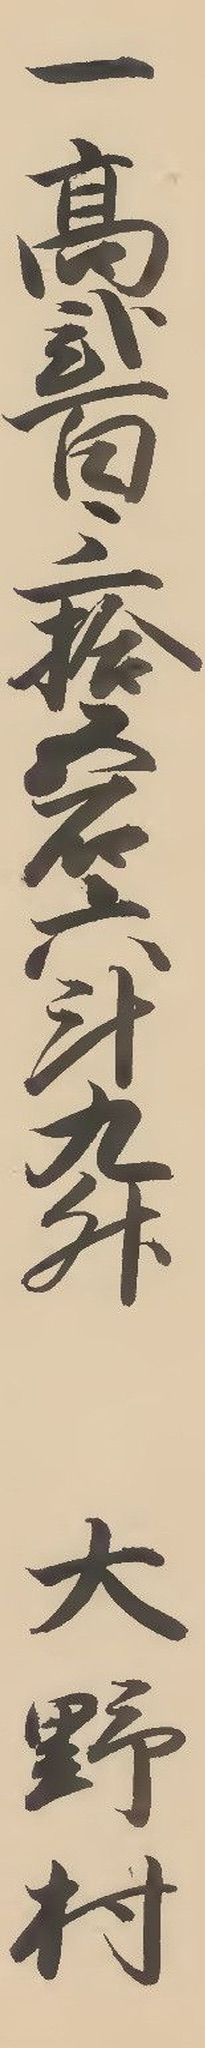一高弐百三拾五石六斗九升大野村
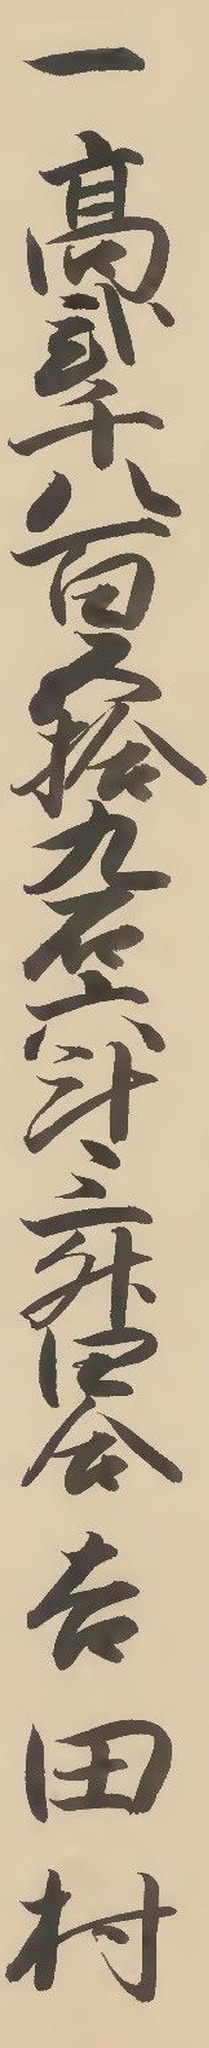一高弐千八百五拾九石六斗三升四合吉田村
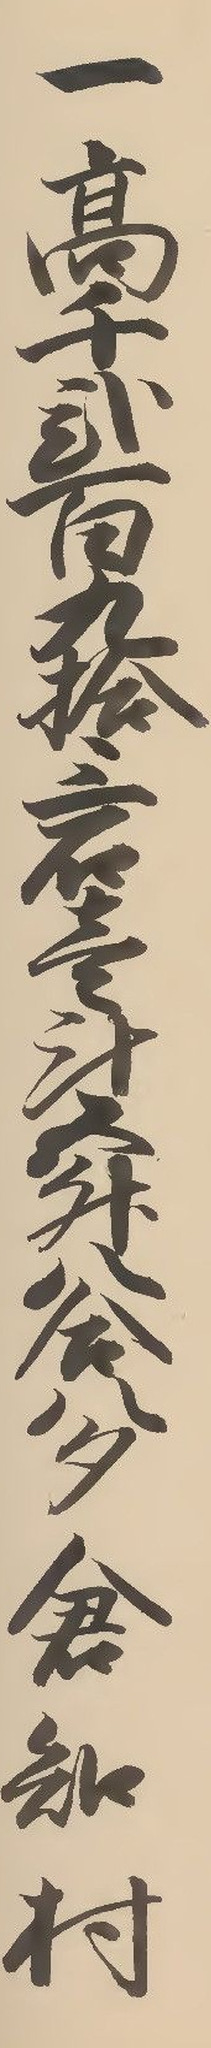一高千弐百九拾三石壱斗五升八合八勺倉知村
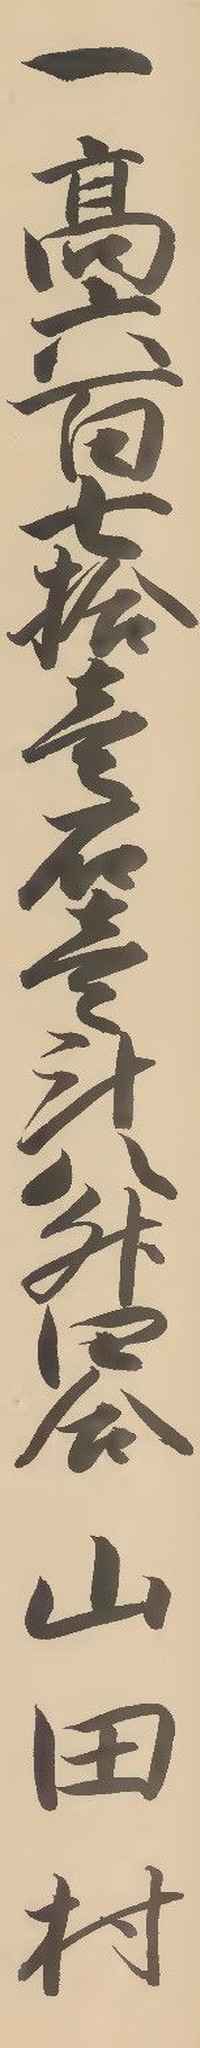一高六百七拾壱石壱斗八升四合山田村
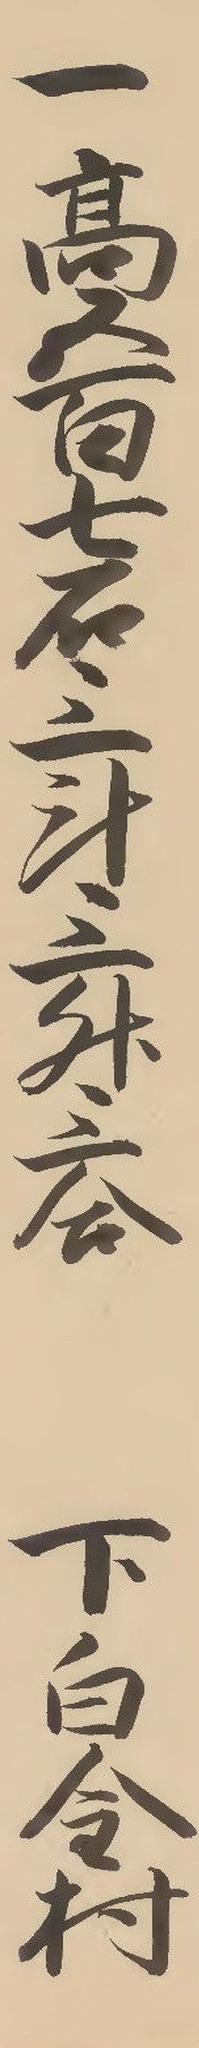一高五百七石三斗三升三合下白金村
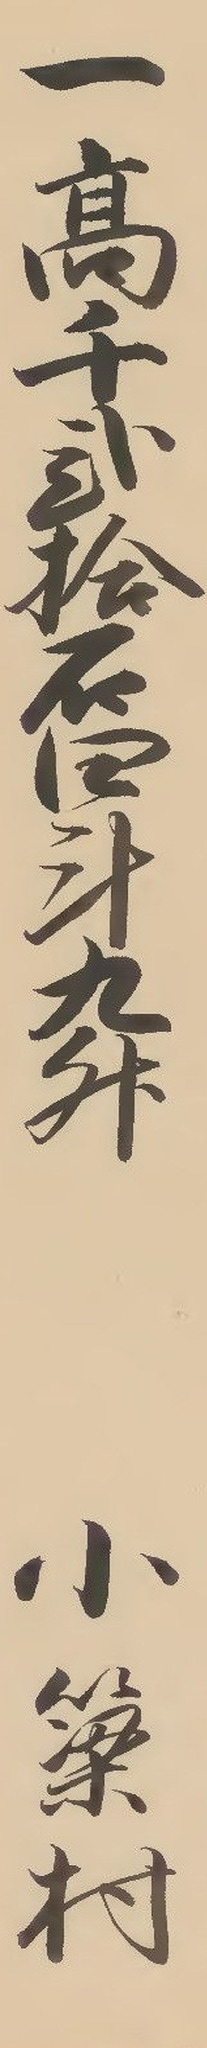一高千弐拾石四斗九升小簗村

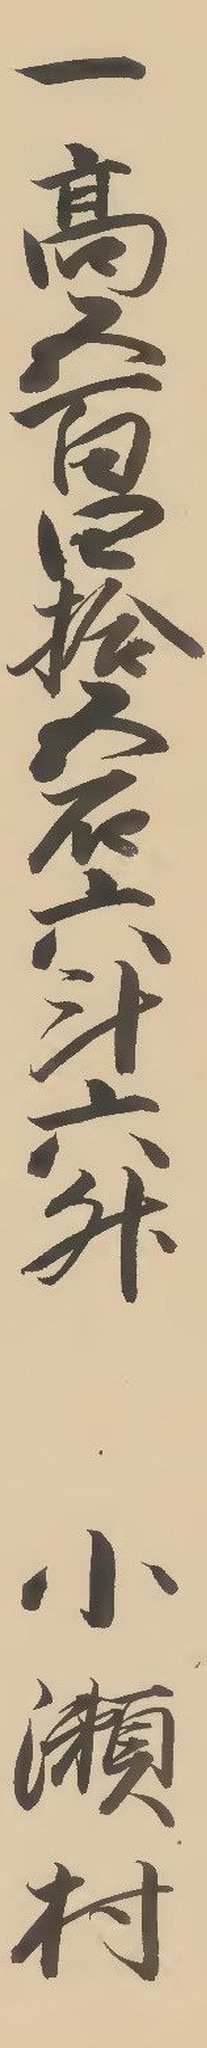一高五百四拾五石六斗六升小瀬村
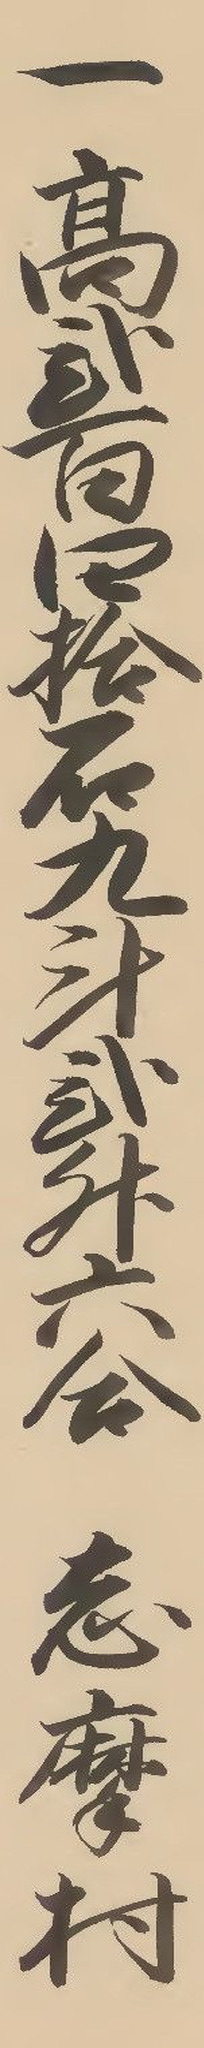一高弐百四拾石九斗弐升六合志摩村
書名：美濃国郷帳
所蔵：国立公文書館 National Archives of Japan
